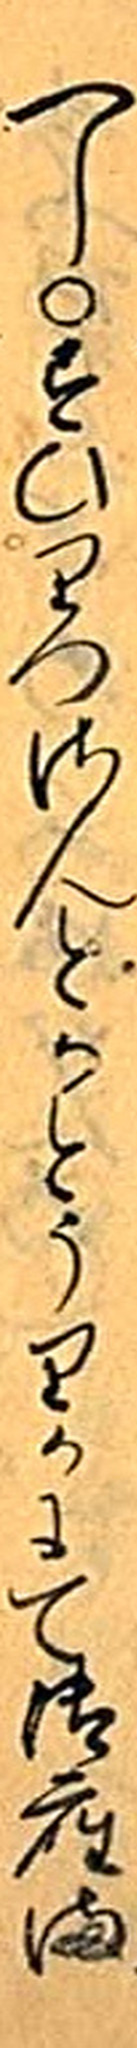へし○すひりつさんとかとうりかにて御座ま
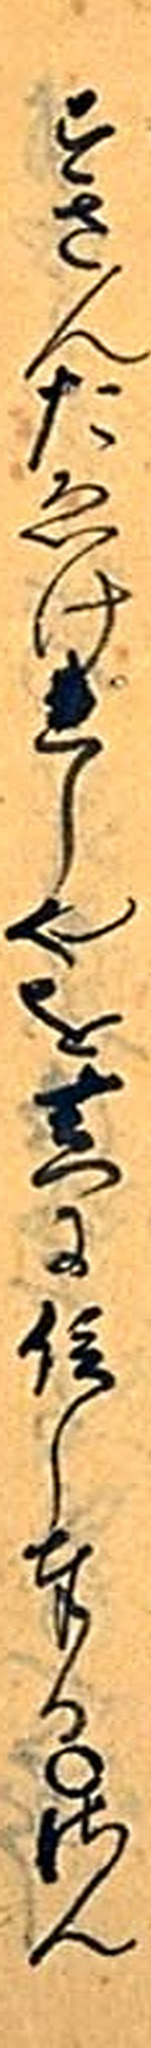すさんたゑけれしやを真に信し奉る○さん
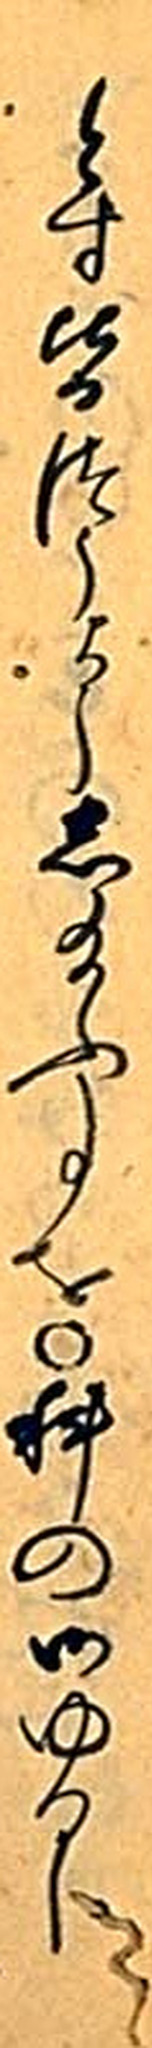とす皆つうようし給ふ事を○科の御ゆるし
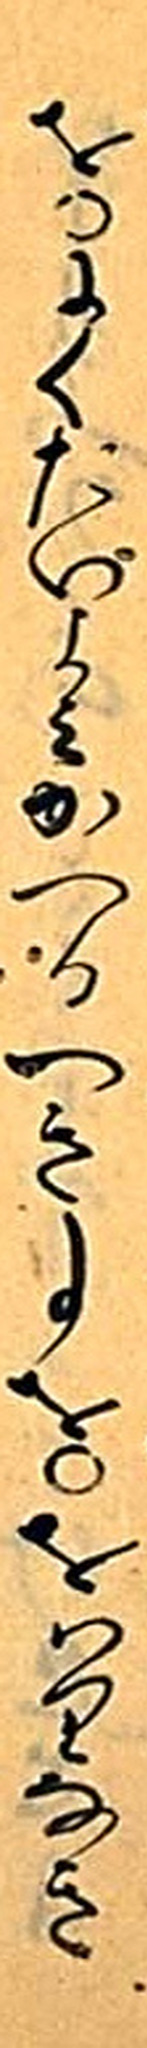を○にくたいよみかへるへき事を○をはりなき
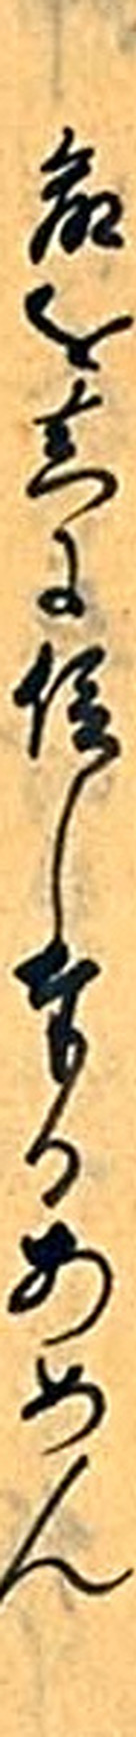命を真に信し奉るあめん
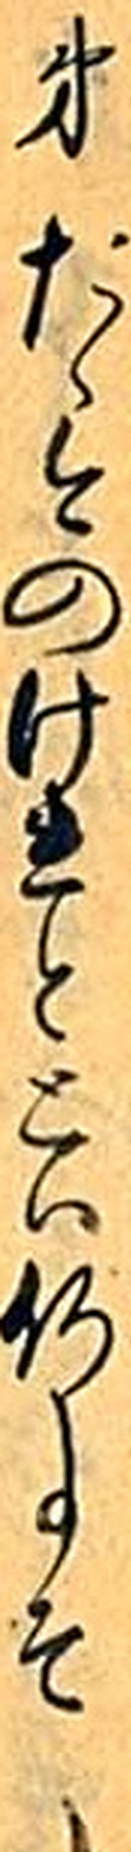弟たゝ今のけれととは何事そ
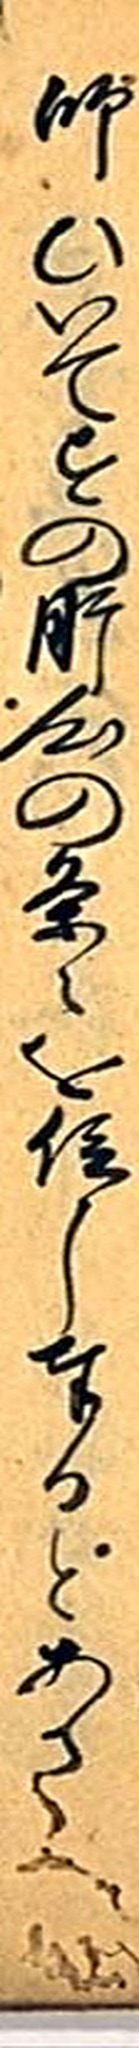師ひいてすの肝心の条々を信し奉るとあ
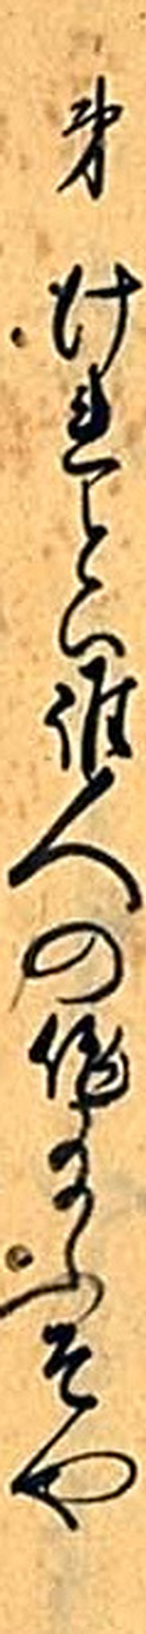弟けれとは誰人の作給ふそや
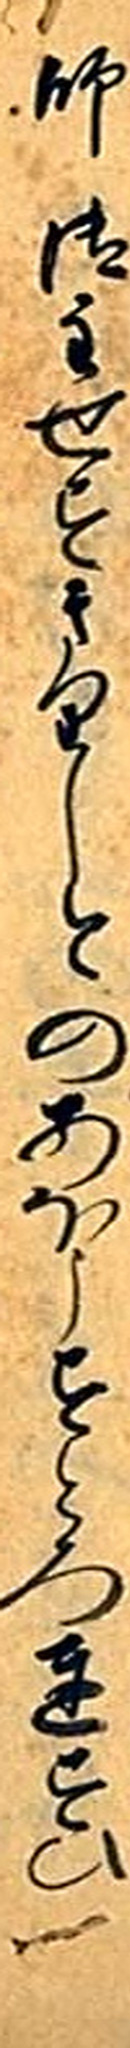師御主せすきりしとのあほうすとろ達すひ
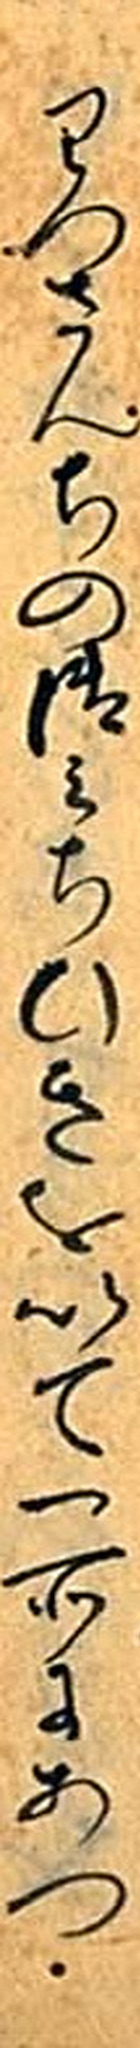りつさんちの御みちひきを以て一所にあつ
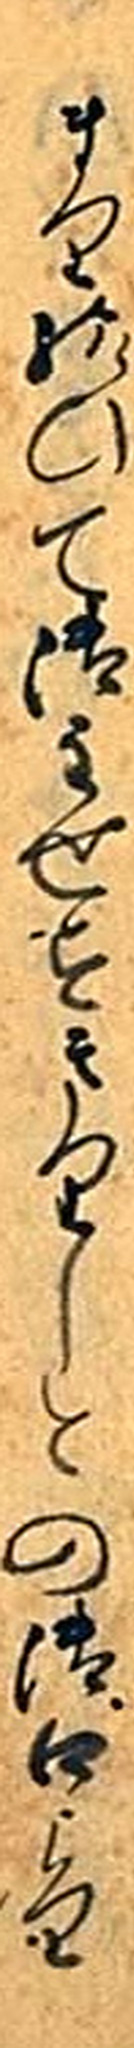まり給ひて御主せすきりしとの御口より
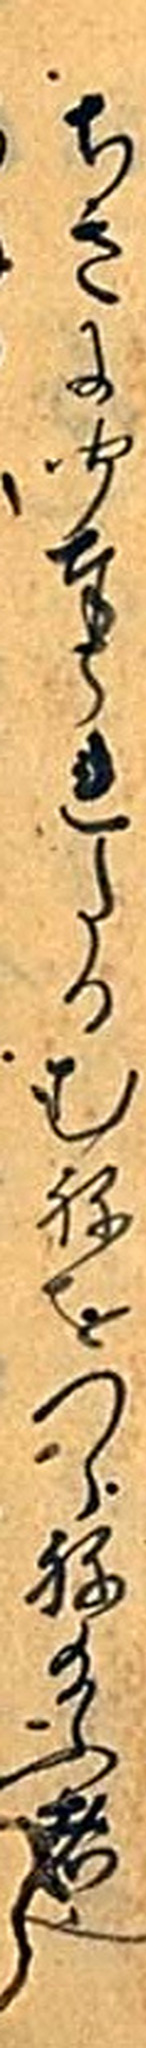ちきに聞奉られたるむねをつらね給ふ者也
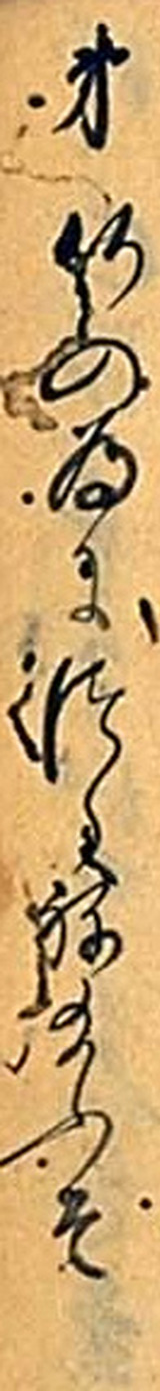弟何の為につらね給ふそ

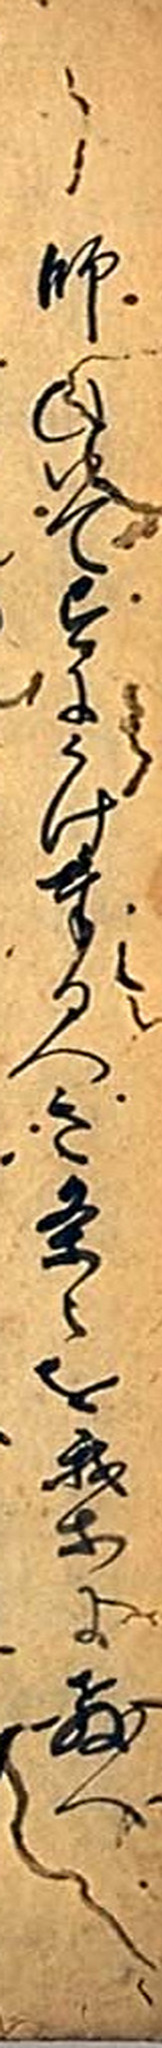師ひいてすにうけ奉るへき条々を我等に教へ
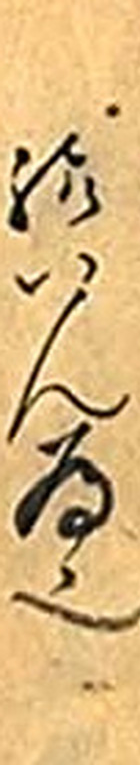給はん為也
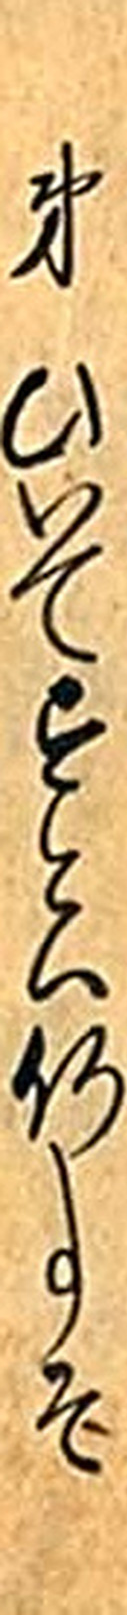弟ひいてすとは何事そ
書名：ドチリナ・キリシタン
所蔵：東京大学総合図書館 / General Library in the University of Tokyo
